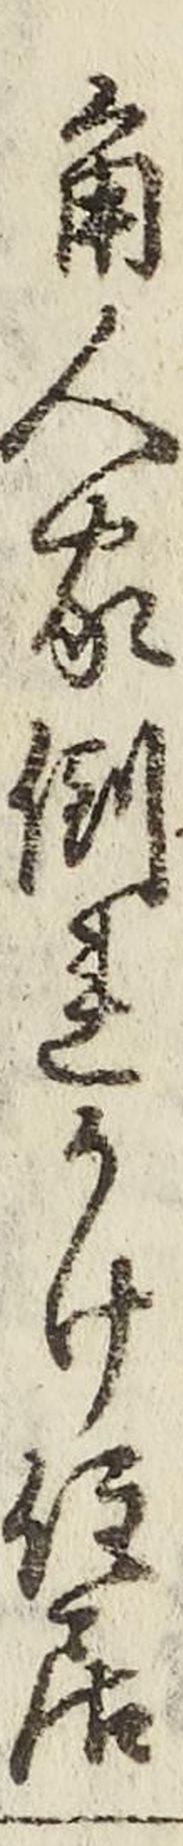角人家倒れかけ住居
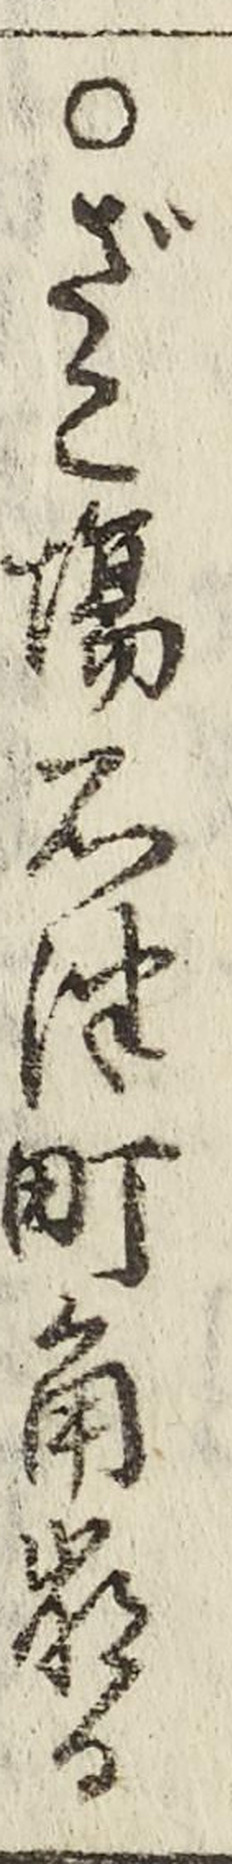○ざこ場石津町角崩る
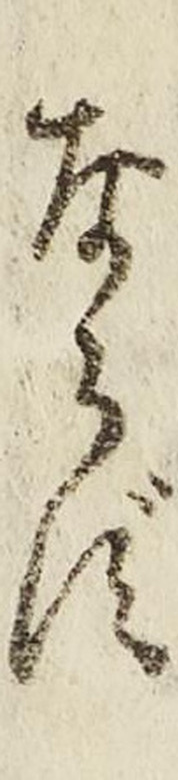ならず
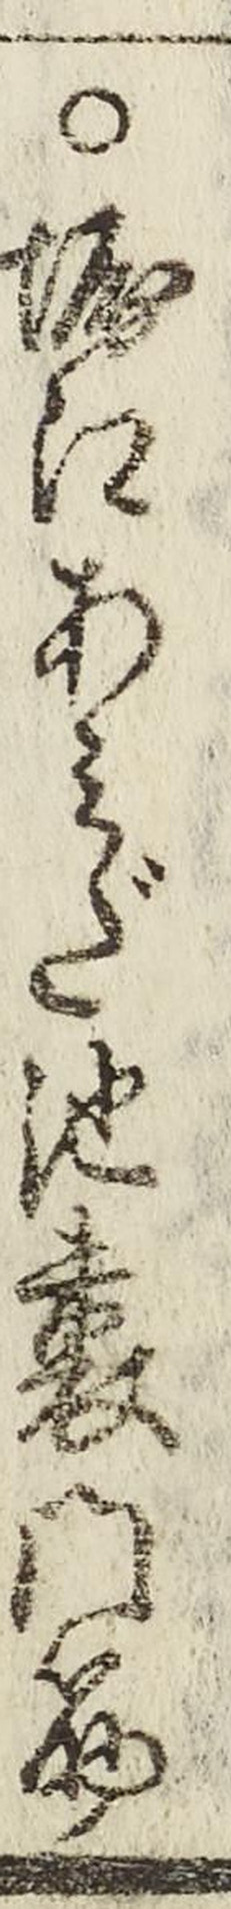○堀江あみだ池裏門筋
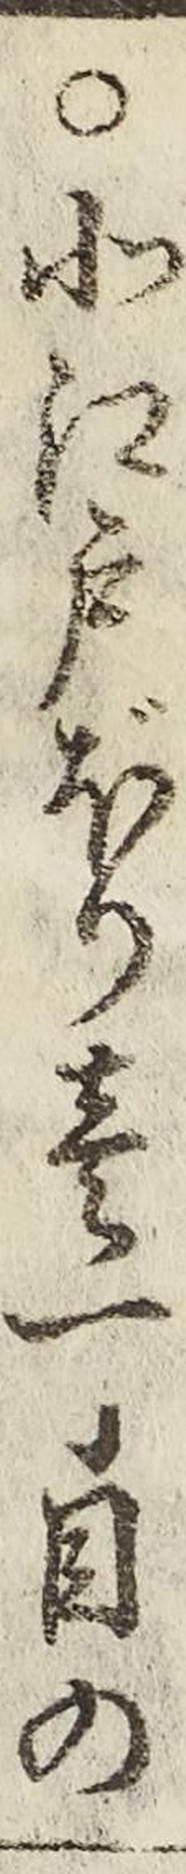○北江戸ぼり壱丁目の
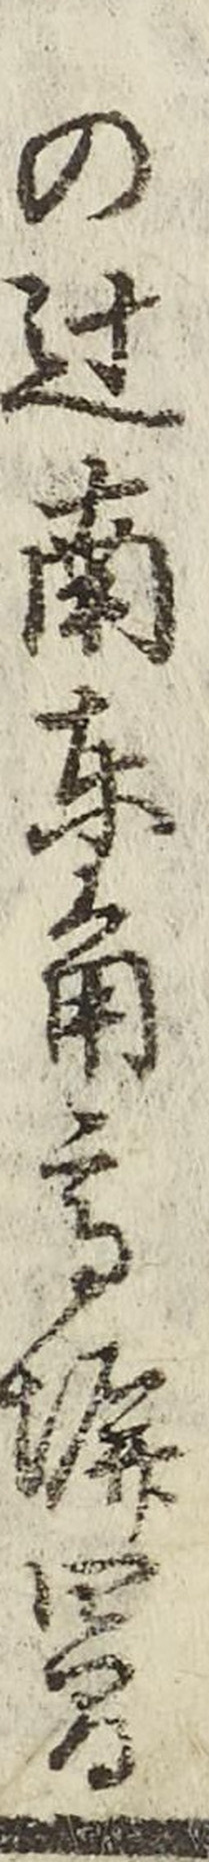の辻南東角高塀四間
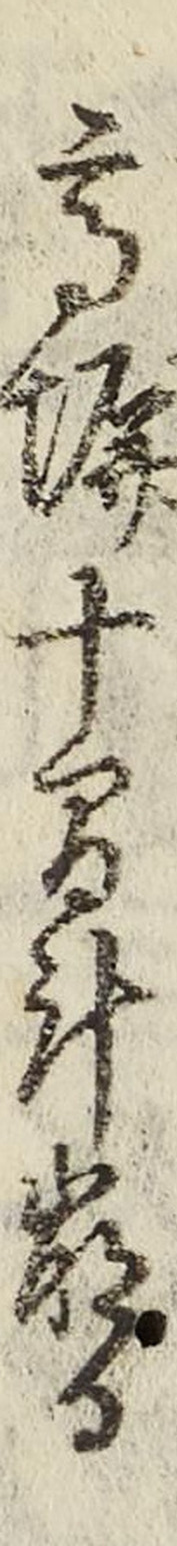高塀十間計崩る
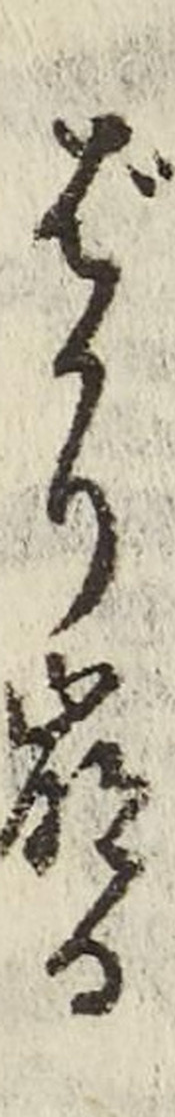ばかり崩る

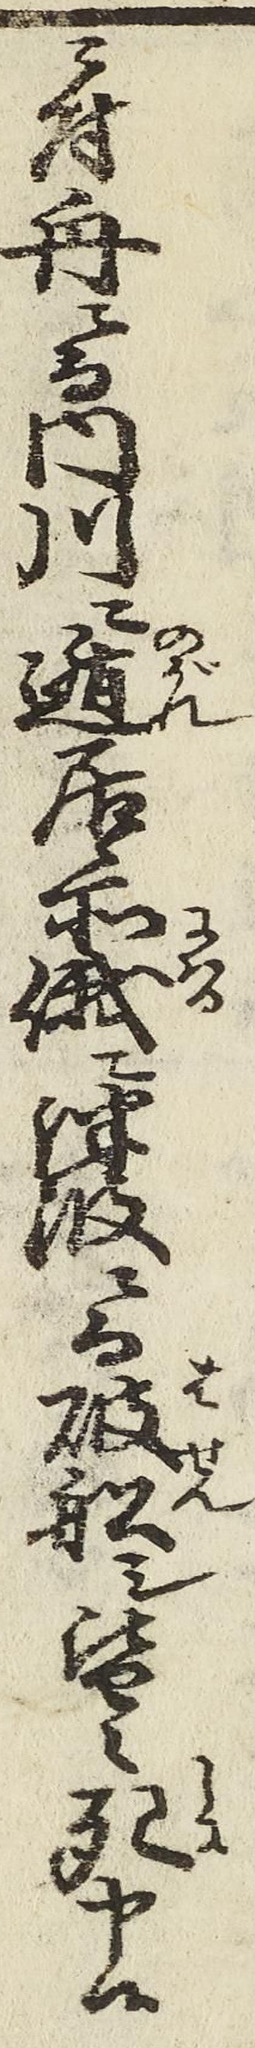ニ付舟ニ而内川ニ遁居候所俄ニ津波ニ而破船シ皆々死申候
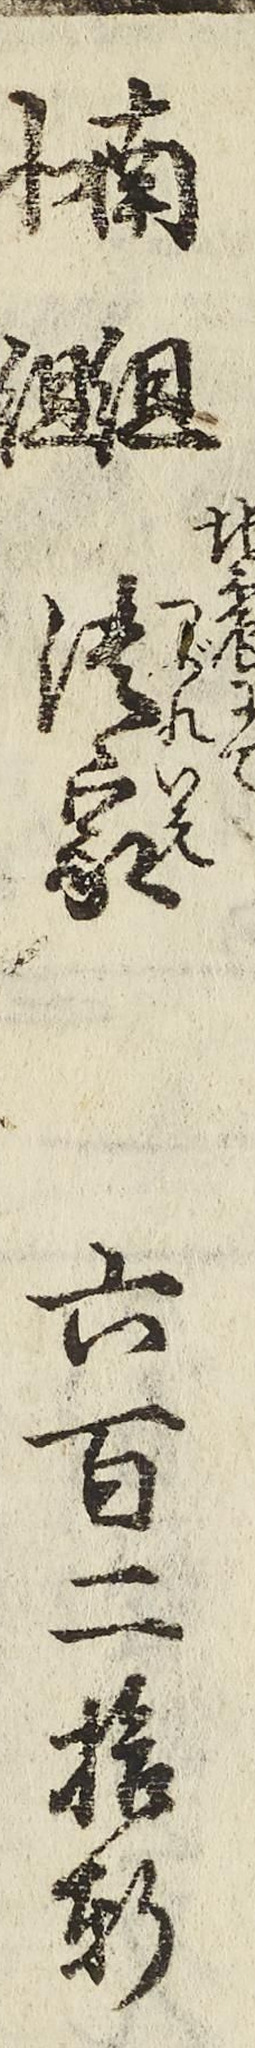北組潰家六百弐拾軒
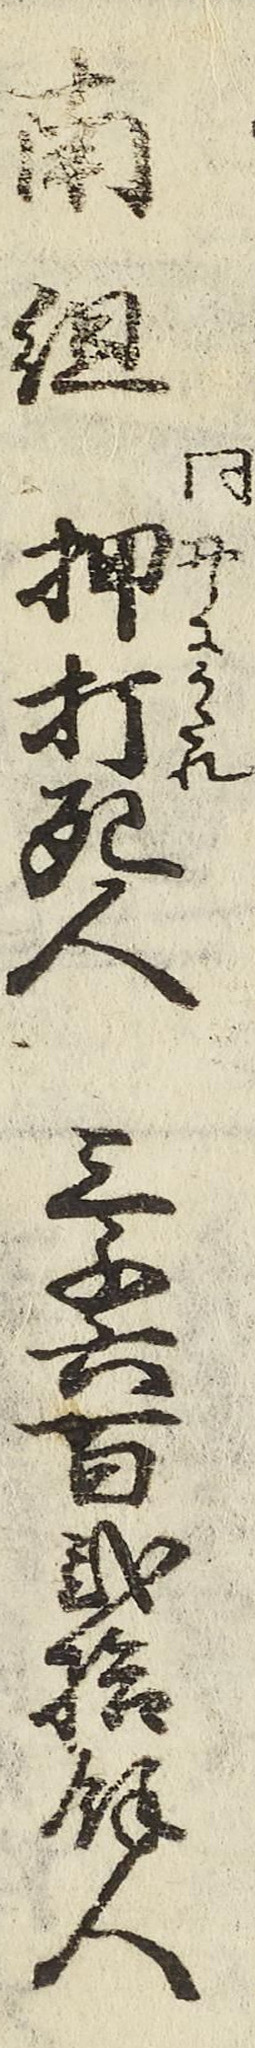南組押打死人三千六百弐拾余人
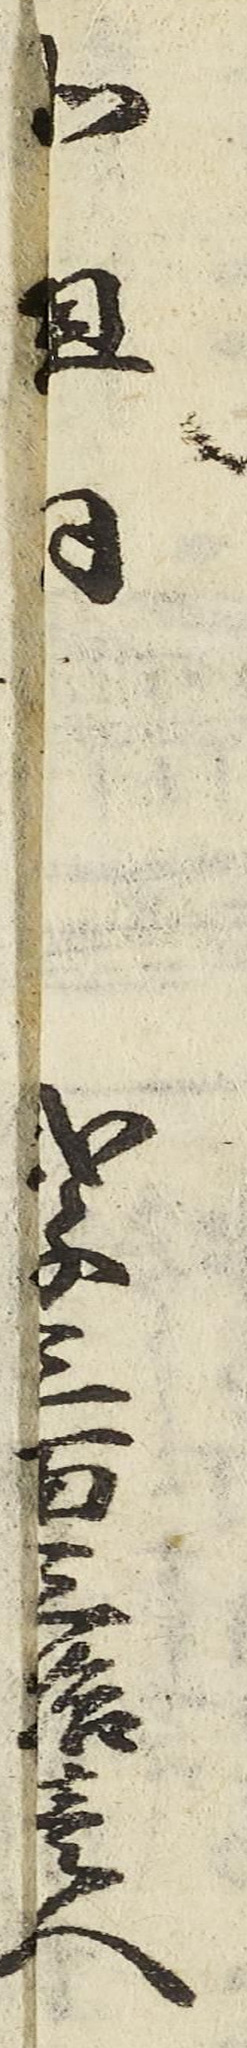北組同弐千三百三拾壱人
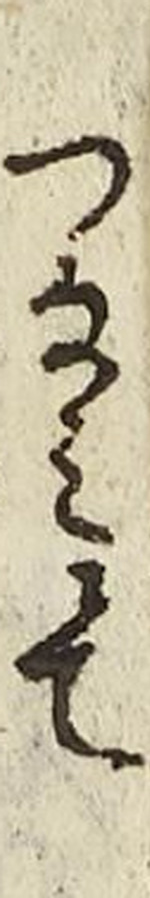つなみニて
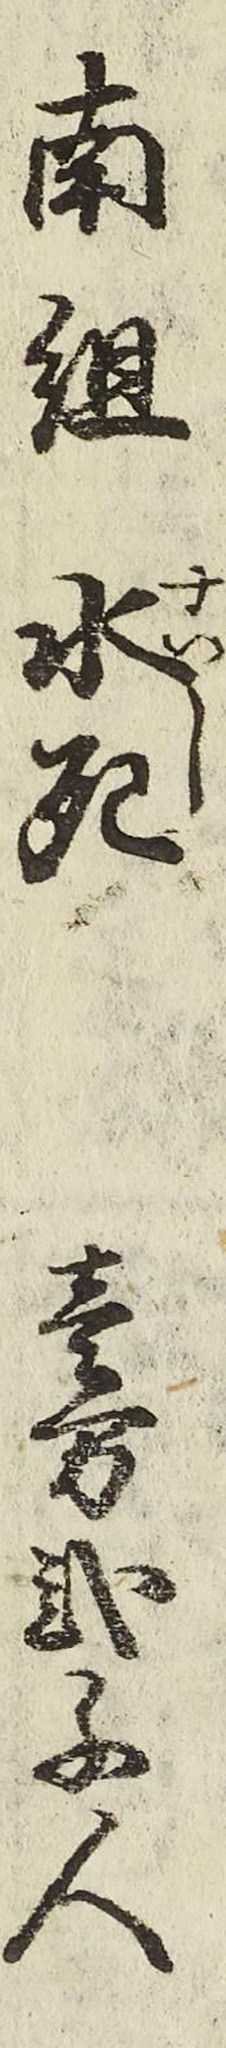南組水死壱万弐千人
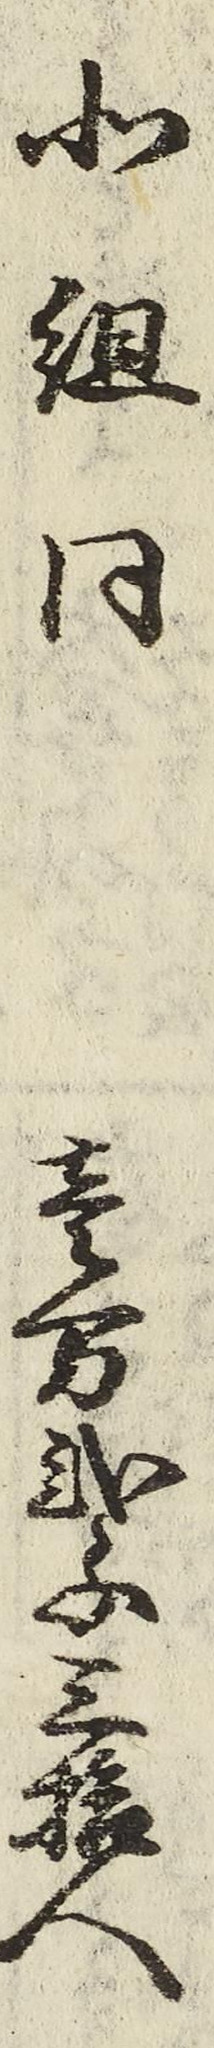北組同壱万弐千三拾人
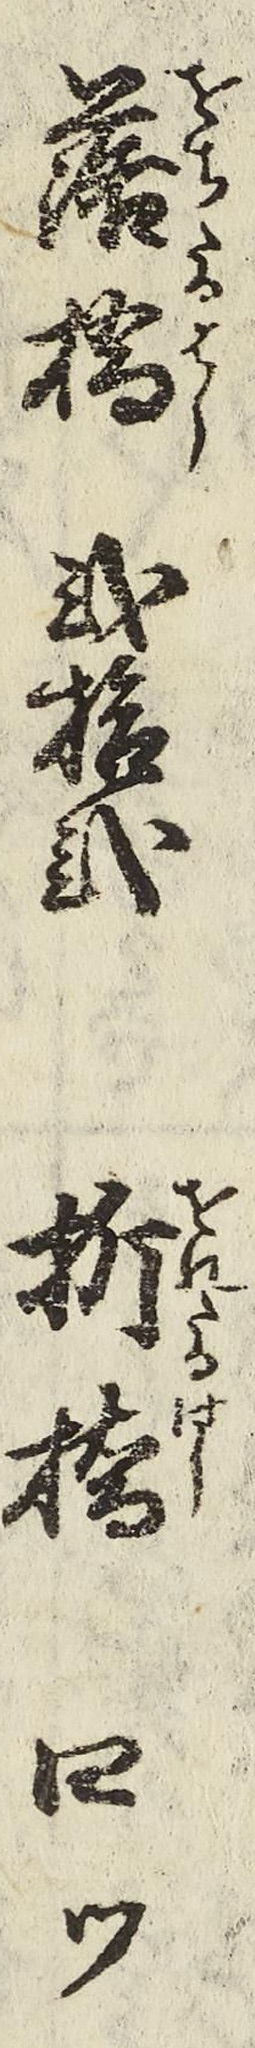落橋弐拾弐折橋四ツ
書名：地震津浪末代噺の種　全
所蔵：東京大学地震研究所図書室 Earthquake Research Institute Library, The University of Tokyo, JAPAN
